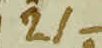21
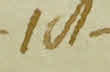18
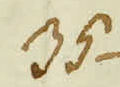35
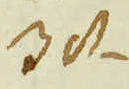38
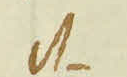8 -
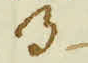3
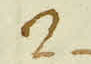2
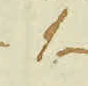1
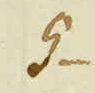5
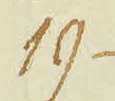19
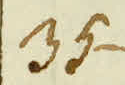35
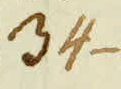34
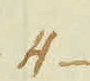4
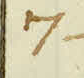7
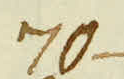70
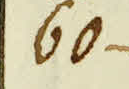60
